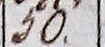50.
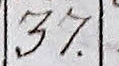37.
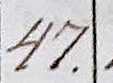47.
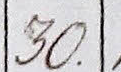30.
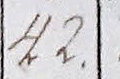42.
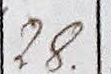28.
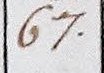67
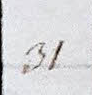31
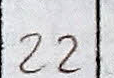22
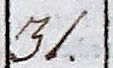31.
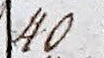40
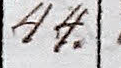44.
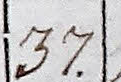37.
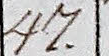47.
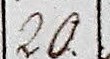20.
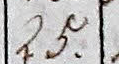25.
